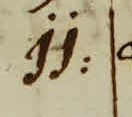11:
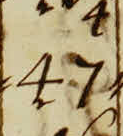47
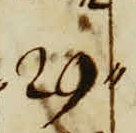29
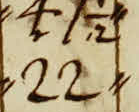22
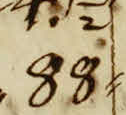88
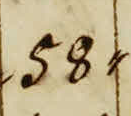58
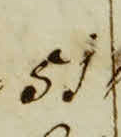51
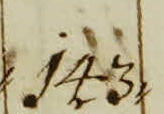143
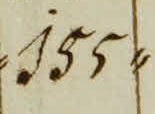155
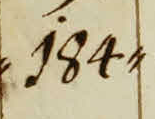184
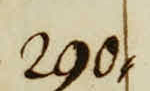290
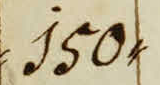150
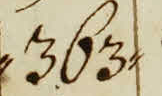363
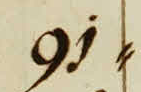91
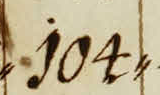104
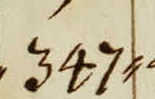347
